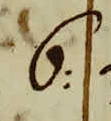6:
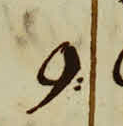9:
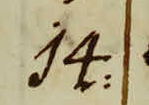14:
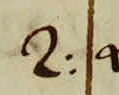2:
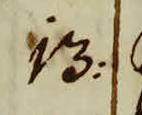13:
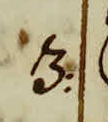3:
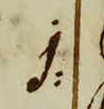1:
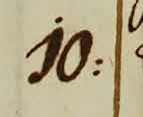10:
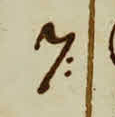7:
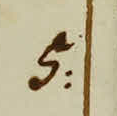5:
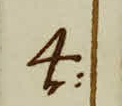4:
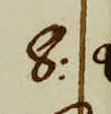8:
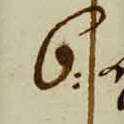6:
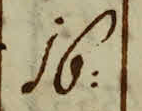16:
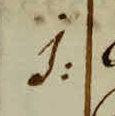1:
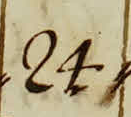24
